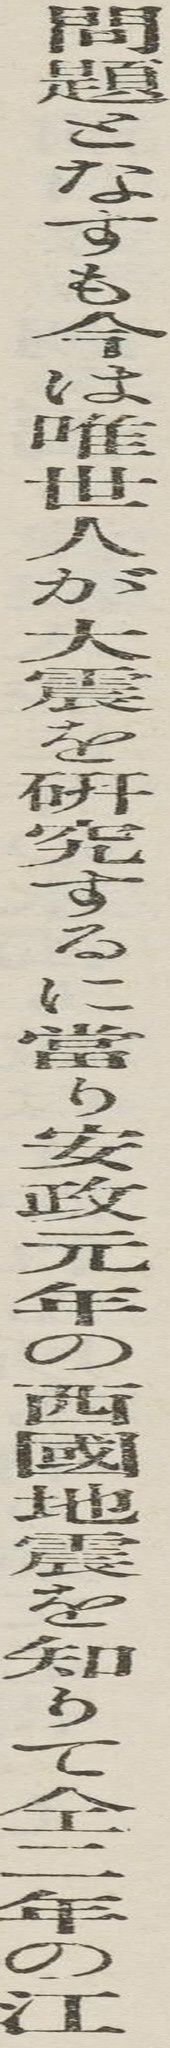問題となすも今は唯世人が大震を研究するに当り安政元年の西国地震を知りて同二年の江
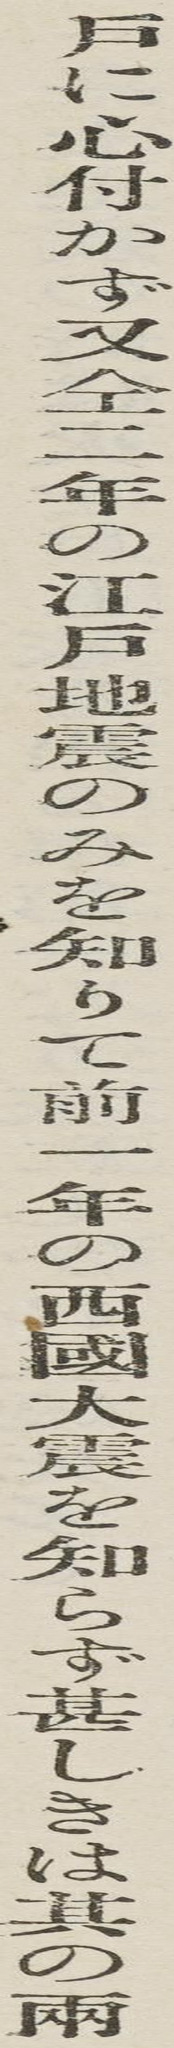戸に心付かず又同二年の江戸地震のみを知りて前一年の西国大震を知らず甚しきは其の両
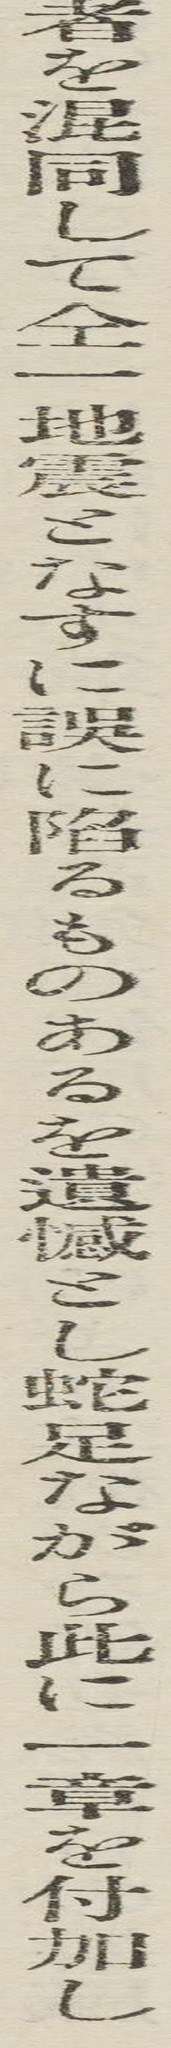者を混同して同一地震となすに誤に陥るものあるを遺憾とし蛇足ながら此に一章を付加し
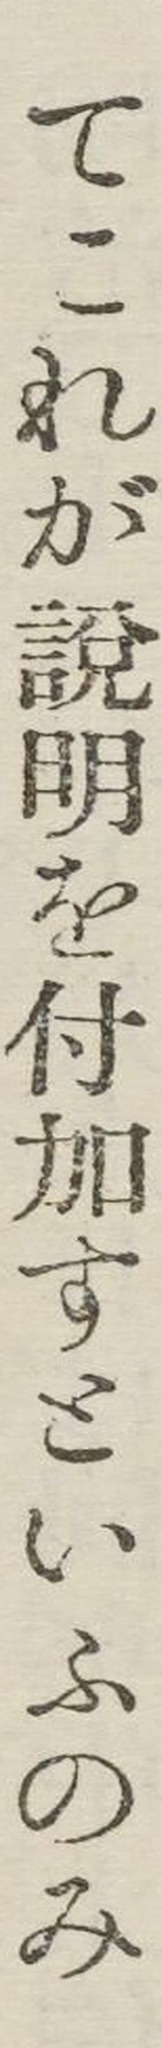てこれが説明を付加すといふのみ
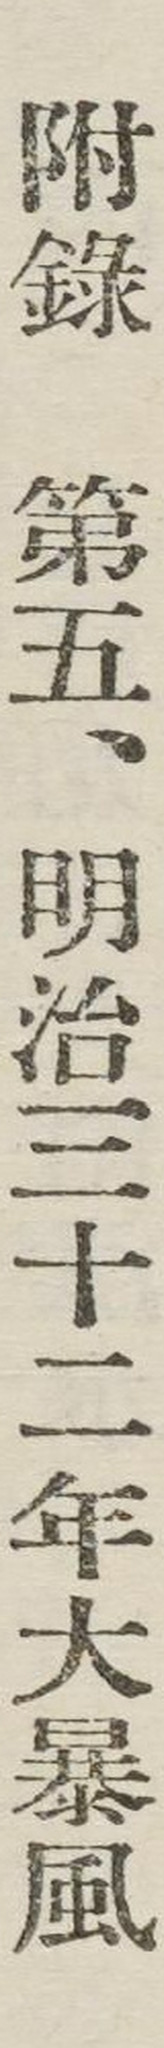附録第五、明治三十二年大暴風
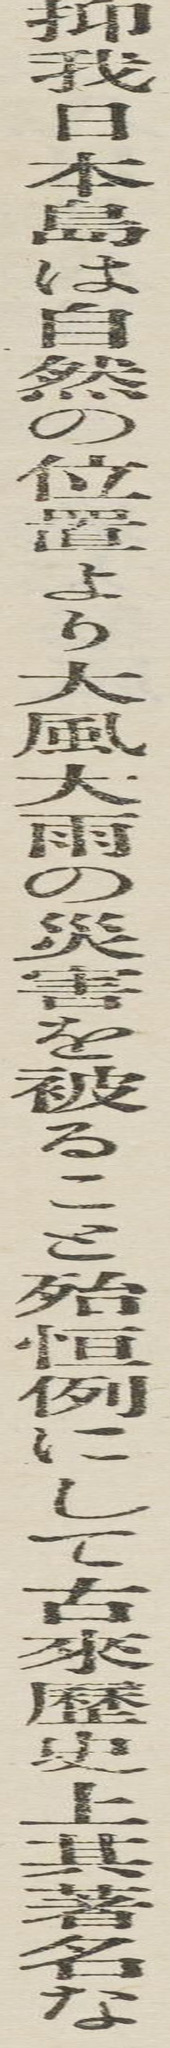抑我日本島は自然の位置より大風大雨の災害を被ること殆恒例にして古来歴史上其著名な
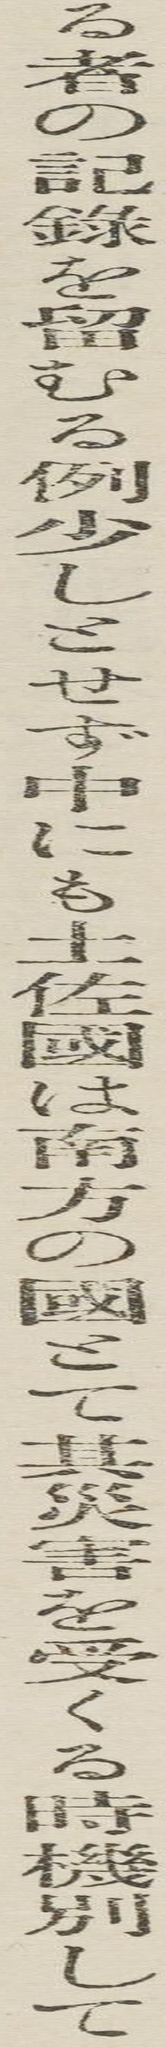る者の記録を留むる例少しとせず中にも土佐国は南方の国とて其災害を受くる時機別して
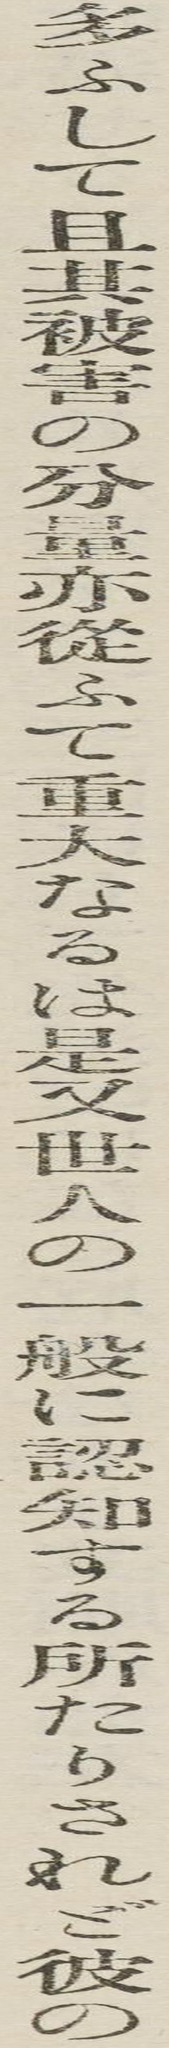多ふして且其被害の分量亦従ふて重大なるは是又世人の一般に認知する所たりされど彼の
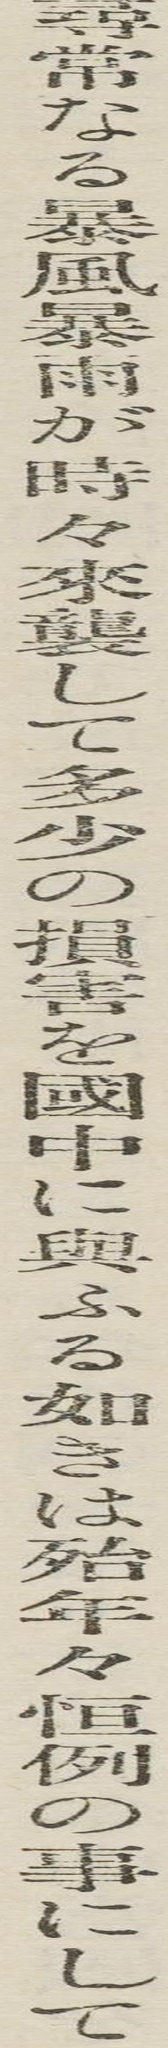尋常なる暴風暴雨が時々来襲して多少の損害を国中に与ふる如きは殆年々恒例の事にして
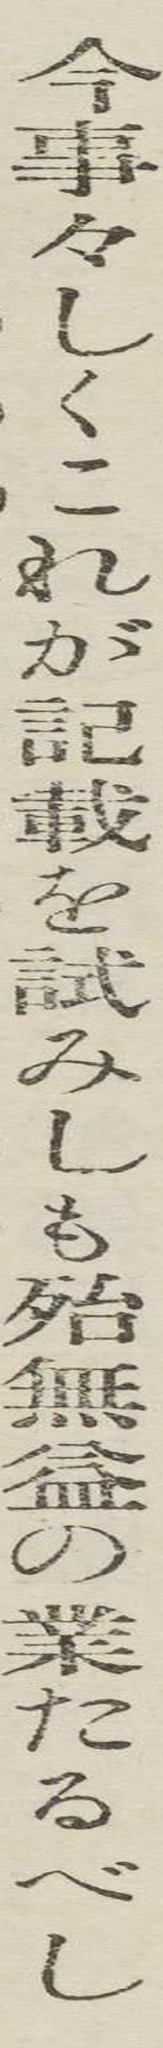今事々しくこれが記載を試みしも殆無益の業たるべし
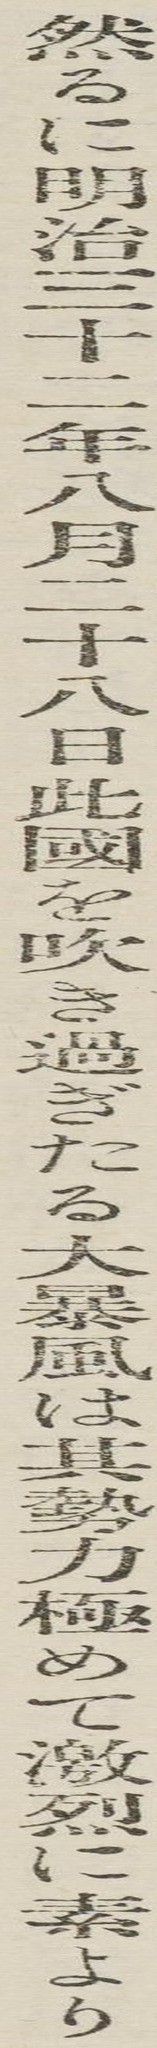然るに明治三十二年八月二十八日此国を吹き過ぎたる大暴風は其勢力極めて激烈に素より
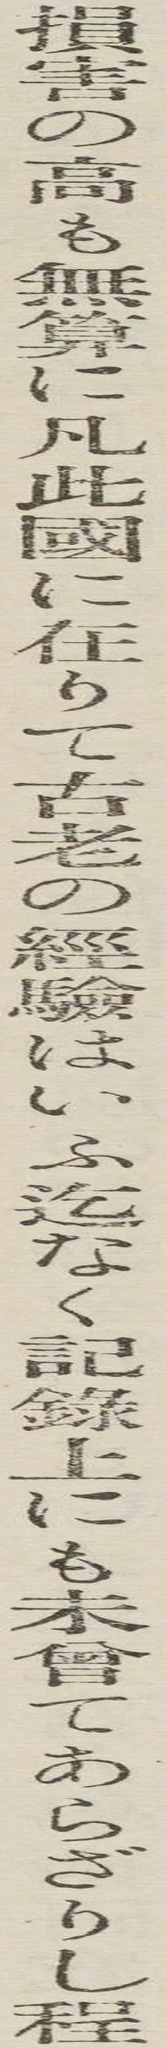損害の高も無算に凡此国に在りて古老の経験はいふ迄なく記録上にも未曾てあらざりし程
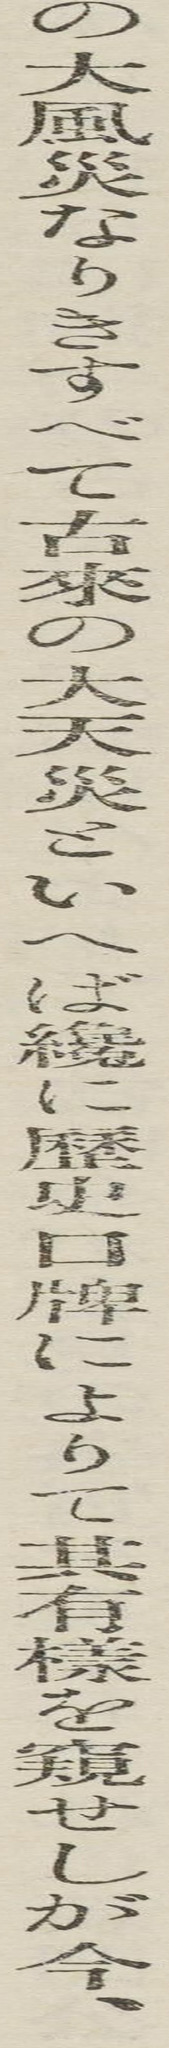の大風災なりきすべて古来の大天災といへば纔に歴史口牌によりて其有様を窺せしが今、
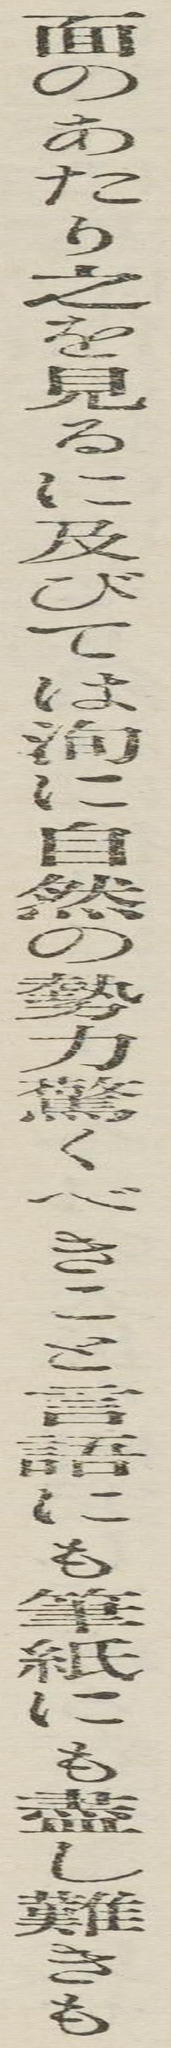面のあたり之を見るに及びては洵に自然の勢力驚くべきこと言語にも筆紙にも尽し難きも
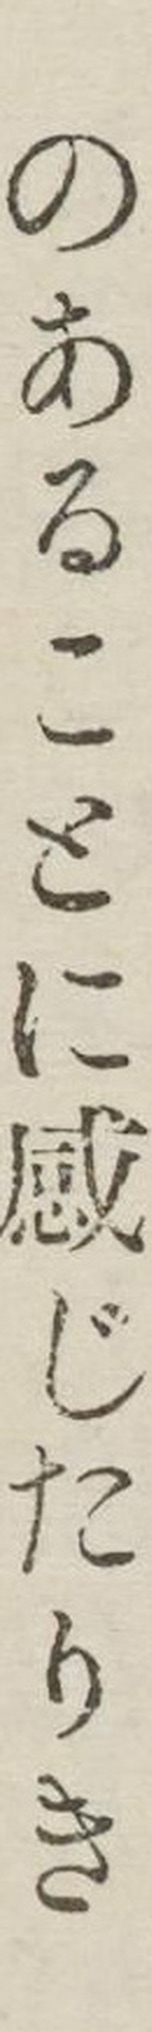のあることに感じたりき
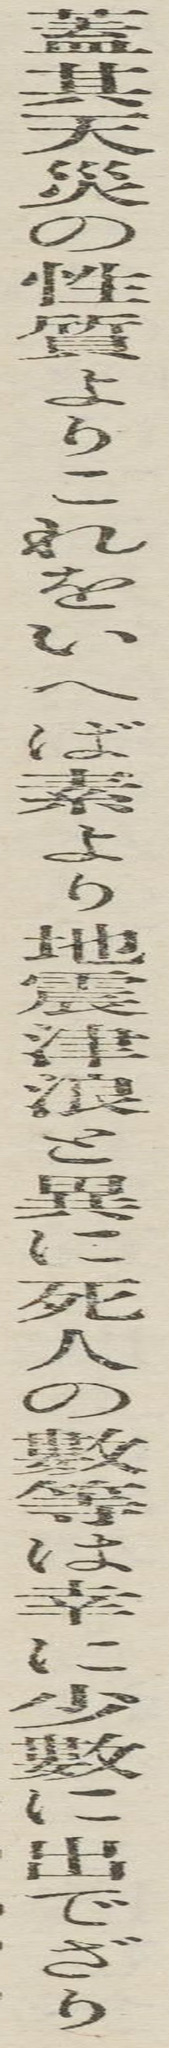蓋其天災の性質よりこれをいへば素より地震津浪と異に死人の数等は幸に少数に出でざり
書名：土佐古今ノ地震
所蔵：東京大学地震研究所図書室 Earthquake Research Institute Library, The University of Tokyo, JAPAN
